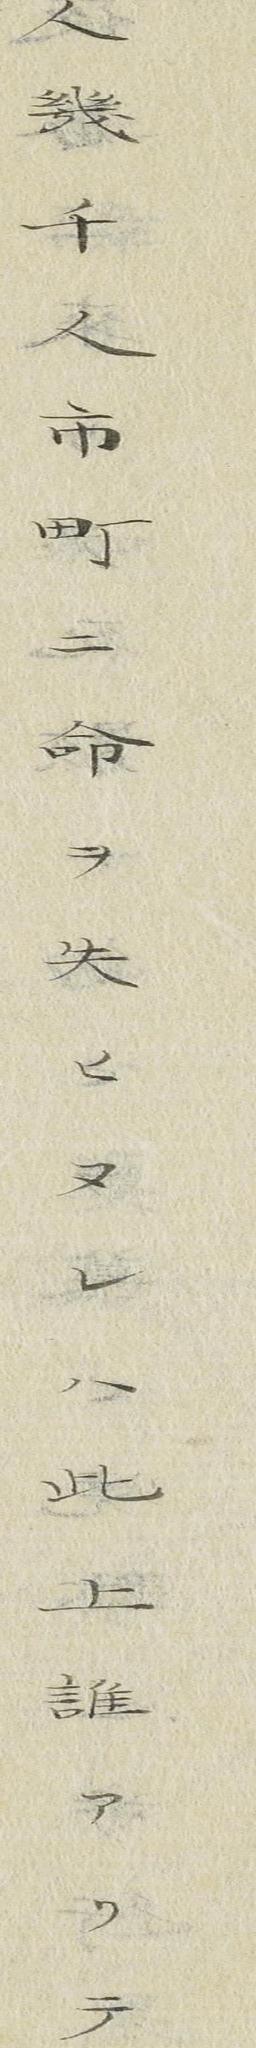人幾千人市町ニ命ヲ失ヒヌレハ此上誰アリテ
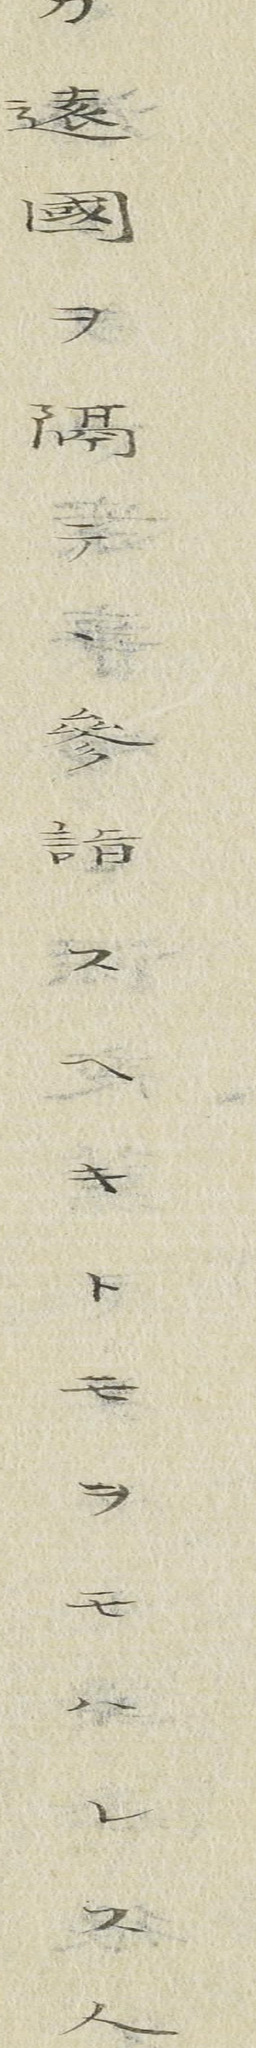カ遠国ヲ隔テヽ参詣スヘキトモヲモハレス人
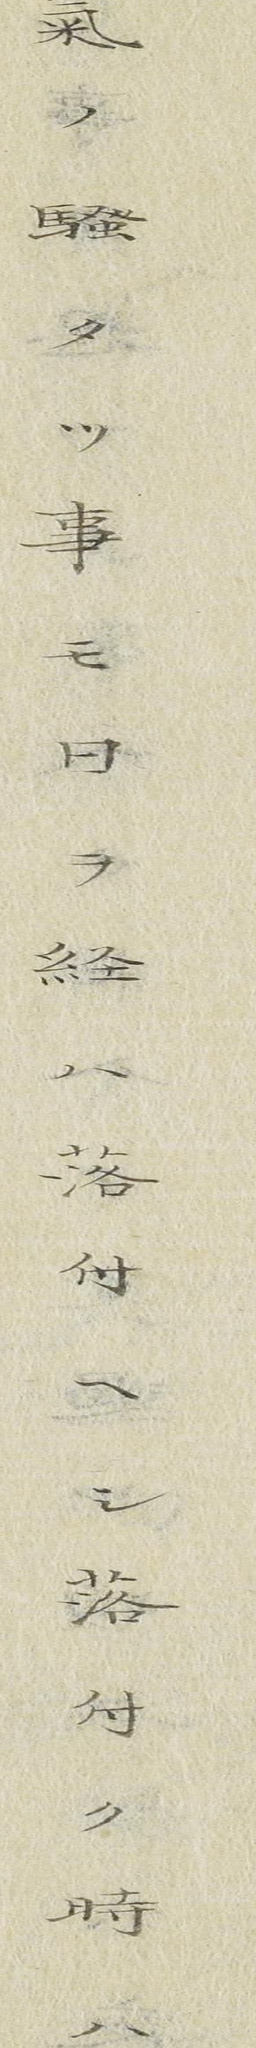気ノ騒タツ事モ日ヲ経ハ落付ヘシ落付ク時ハ
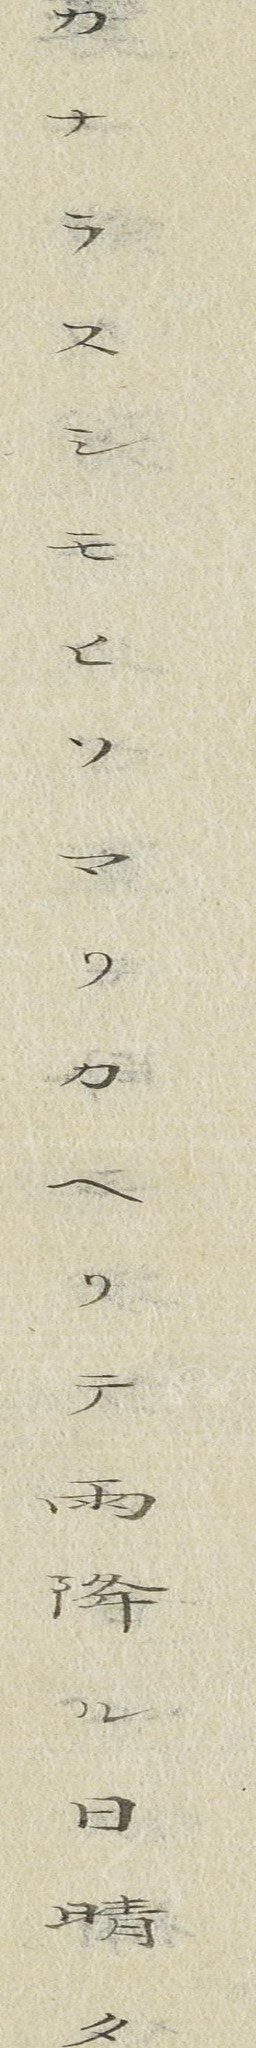カナラスシモヒソマリカヘリテ雨降ル日晴タ
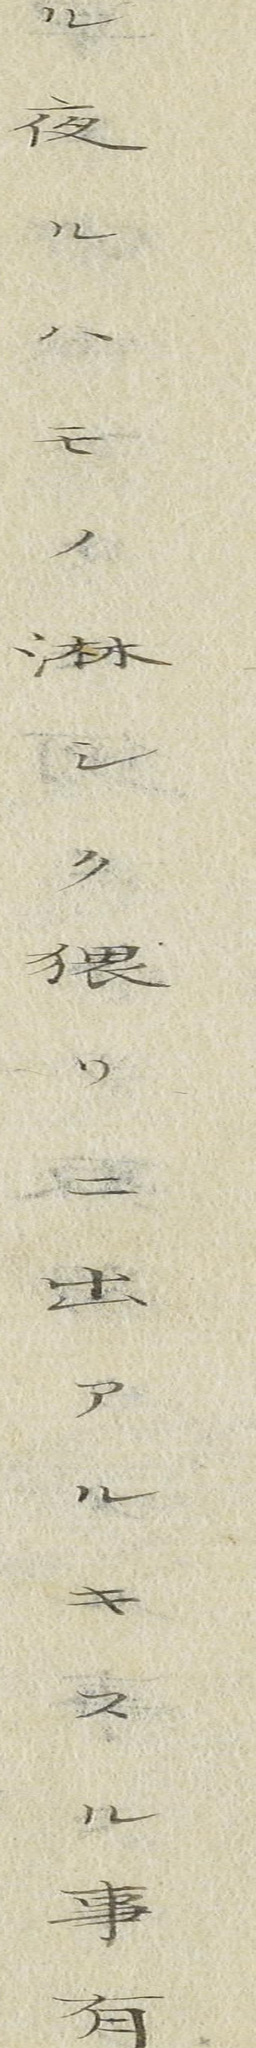ル夜ルハモノ淋シク猥リニ出アルキスル事有
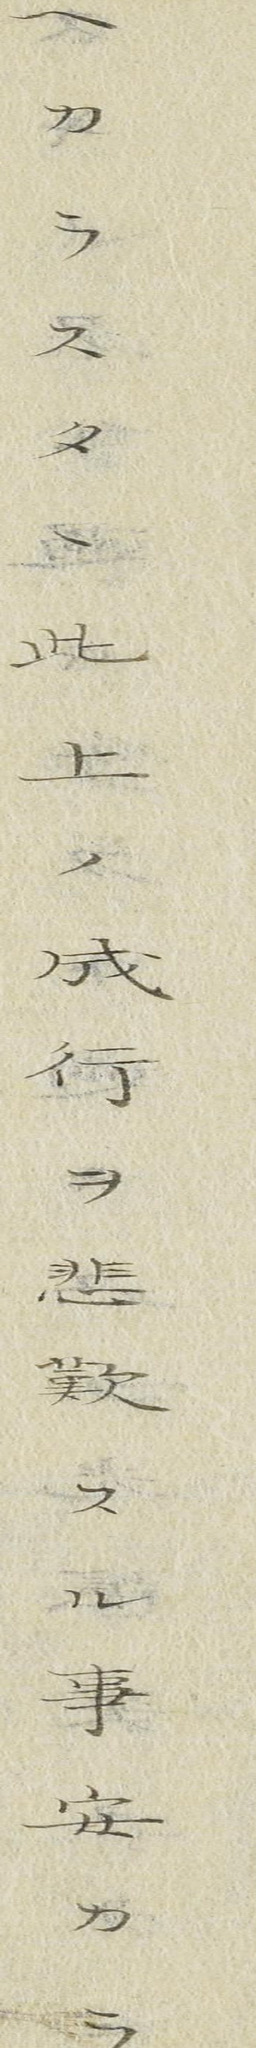ヘカラスタヽ此上ノ成行ヲ悲歎スル事安カラ
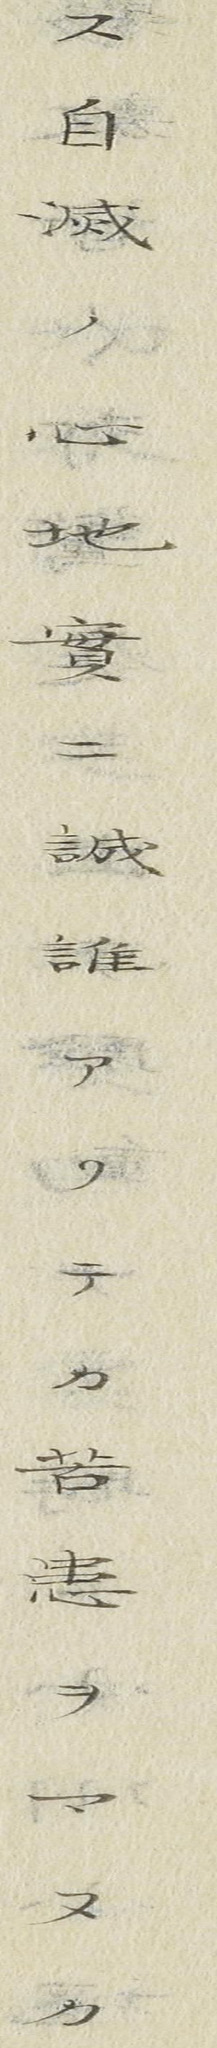ス自滅ノ心地実ニ誠誰アリテカ苦患ヲマヌカ
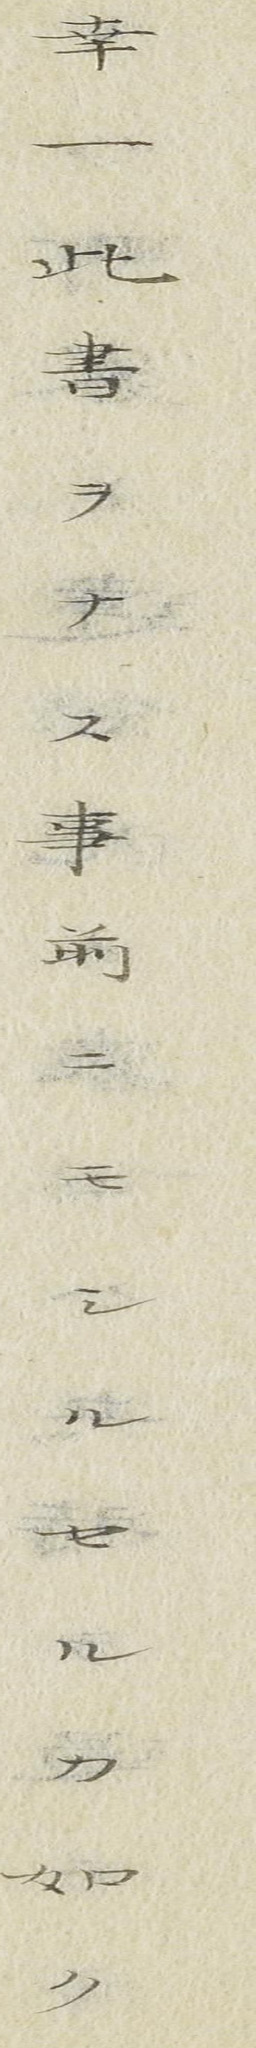幸一此書ヲナス事前ニモシルセルカ如ク
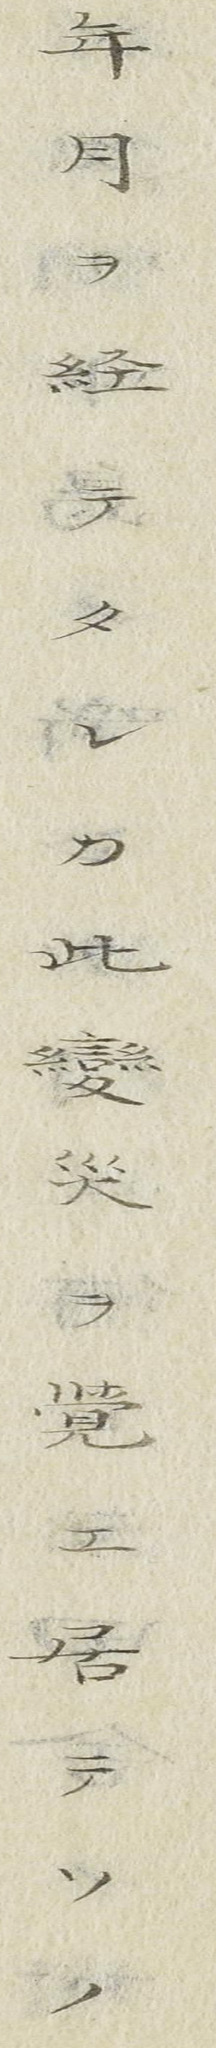年月ヲ経テタレカ此変災ヲ覚エ居テソノ
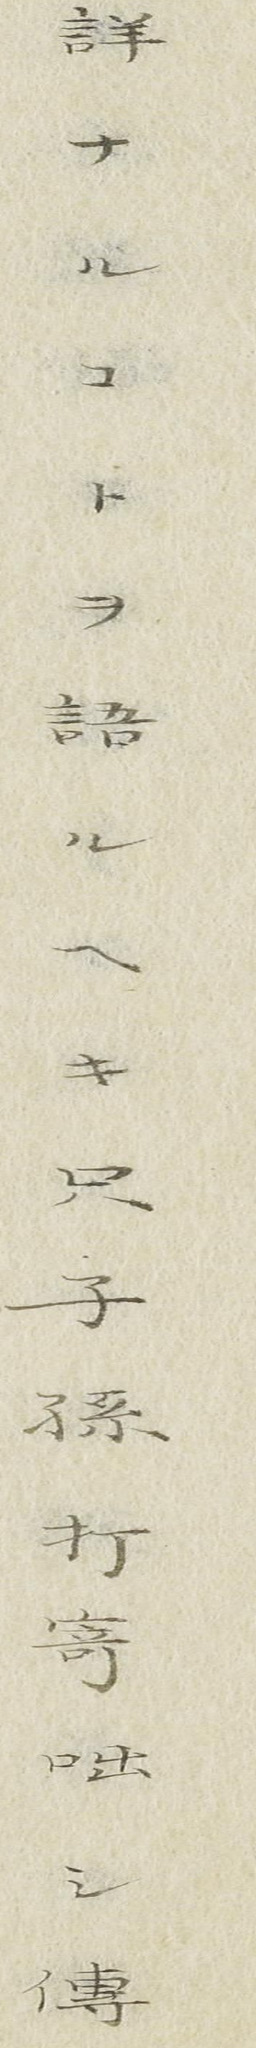詳ナルコトヲ語ルヘキ只子孫打寄咄シ伝
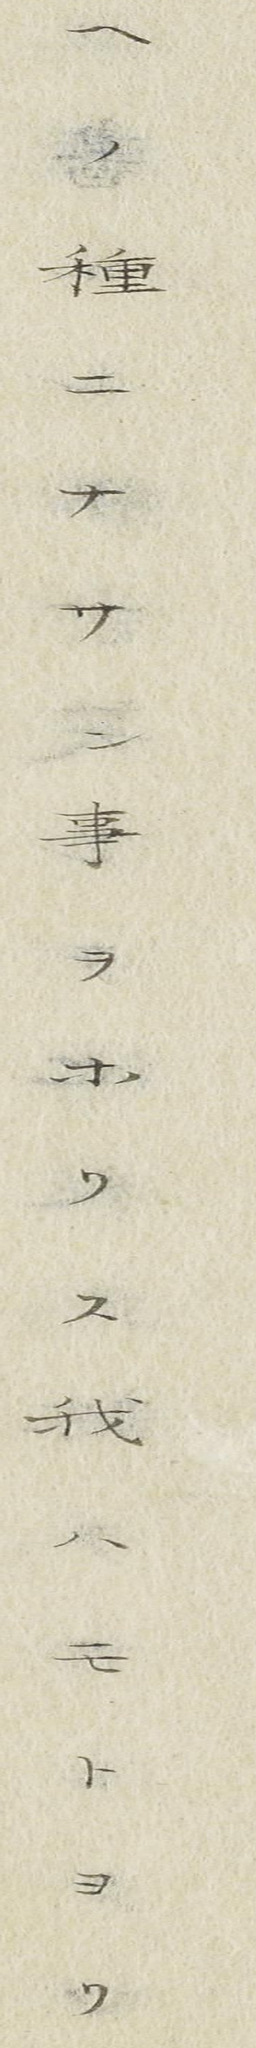ヘノ種ニナサン事ヲホリス我ハモトヨリ
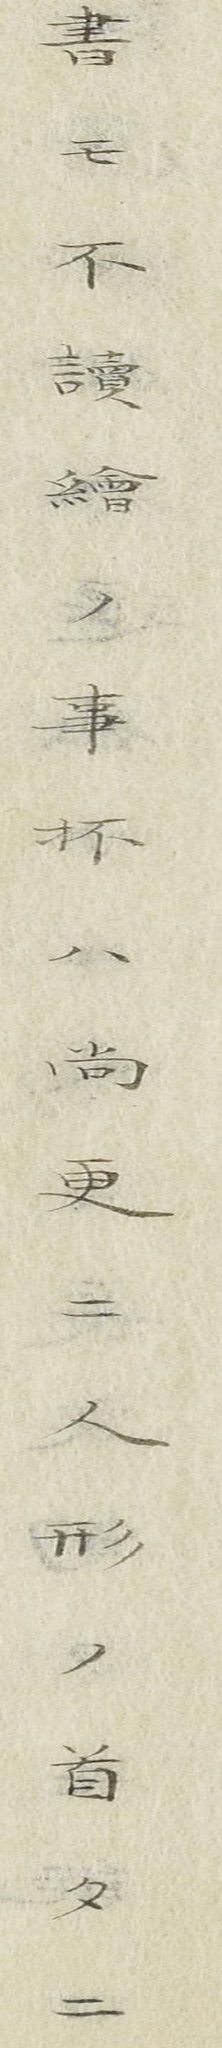書モ不読絵ノ事抔ハ尚更ニ人形ノ首タニ
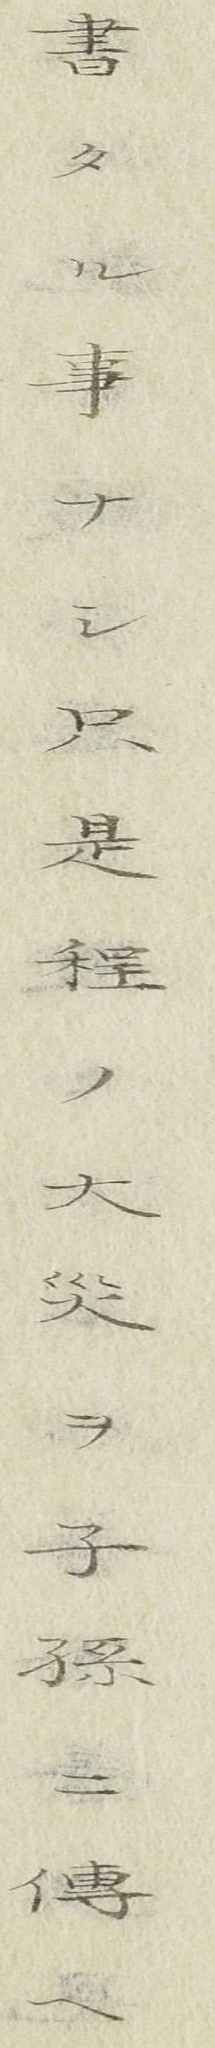書タル事ナシ只是程ノ大災ヲ子孫ニ伝ヘ
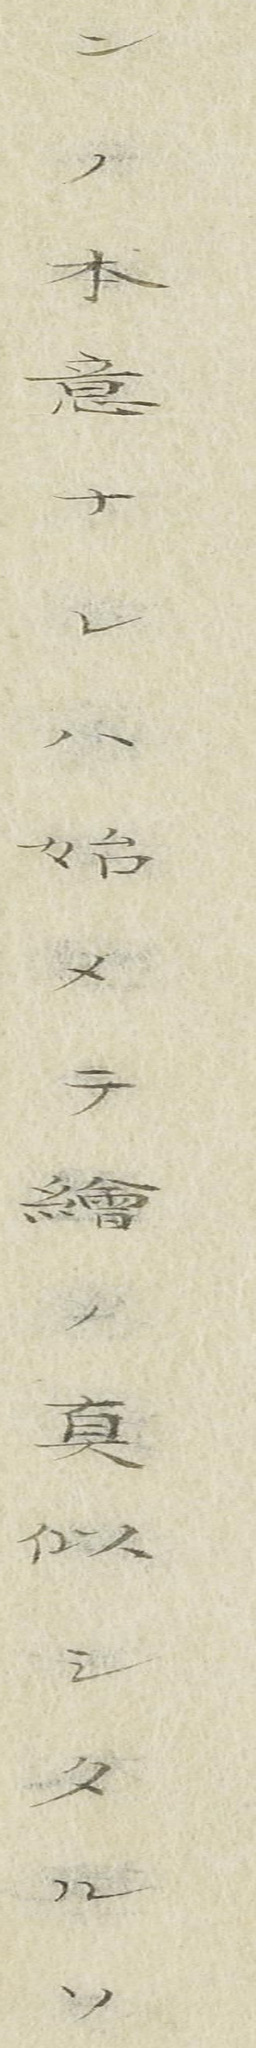ンノ本意ナレハ始メテ絵ノ真似シタルソ
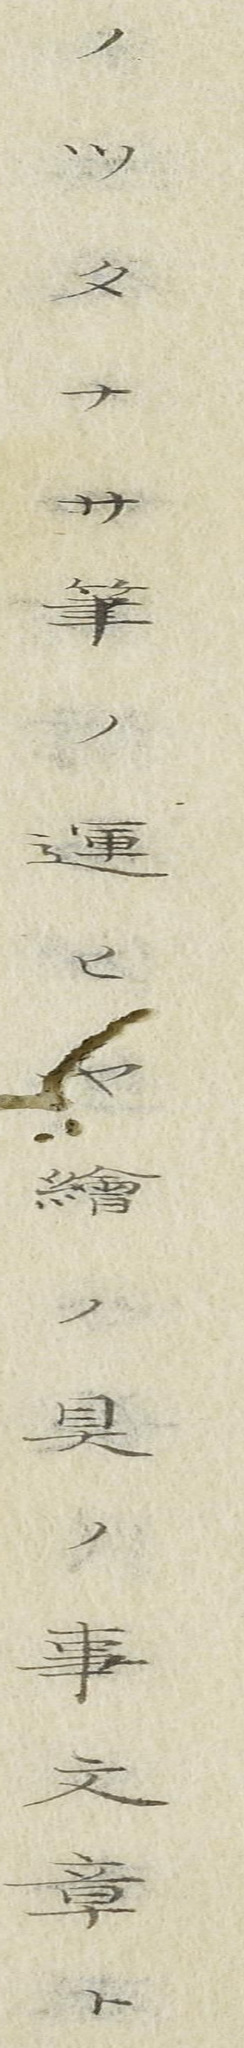ノツタナサ筆ノ運ヒヤ絵ノ具ノ事文章ト

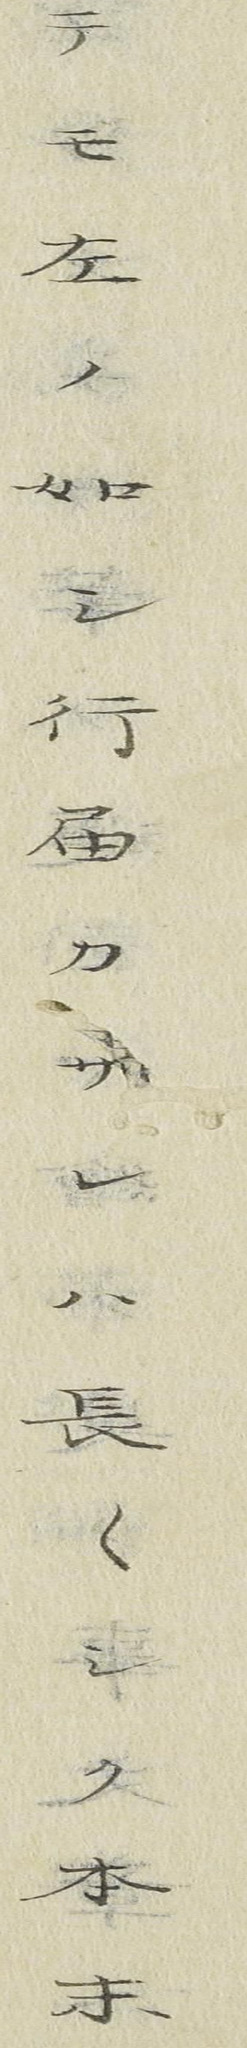テモ左ノ如シ行届カザレハ長〱シク本末
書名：地災撮要　地震之部　巻ノ二
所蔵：東京大学地震研究所図書室 Earthquake Research Institute Library, The University of Tokyo, JAPAN
